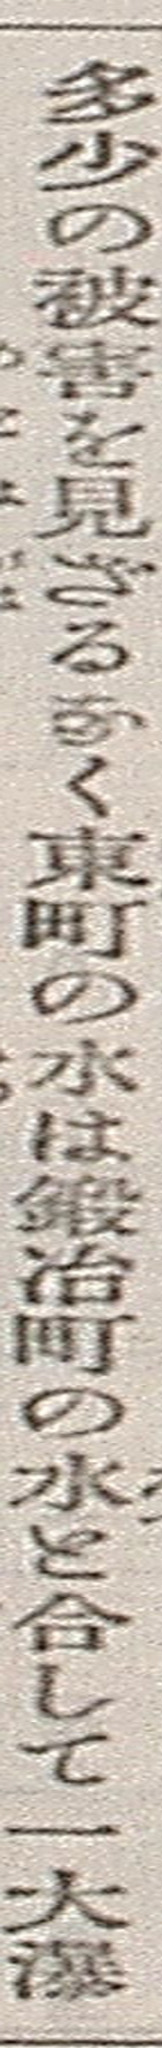多少の被害を見ざるなく東町の水は鍛治町の水と合して一大瀑
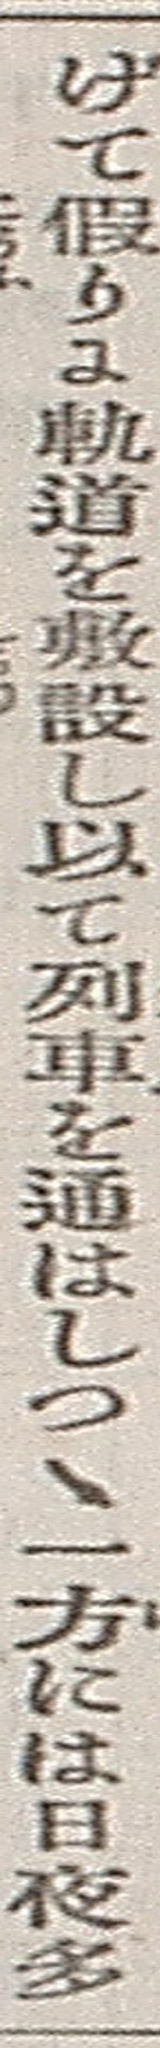がて仮りに軌道を敷設し以て列車を通はしつゝ一方には日夜多
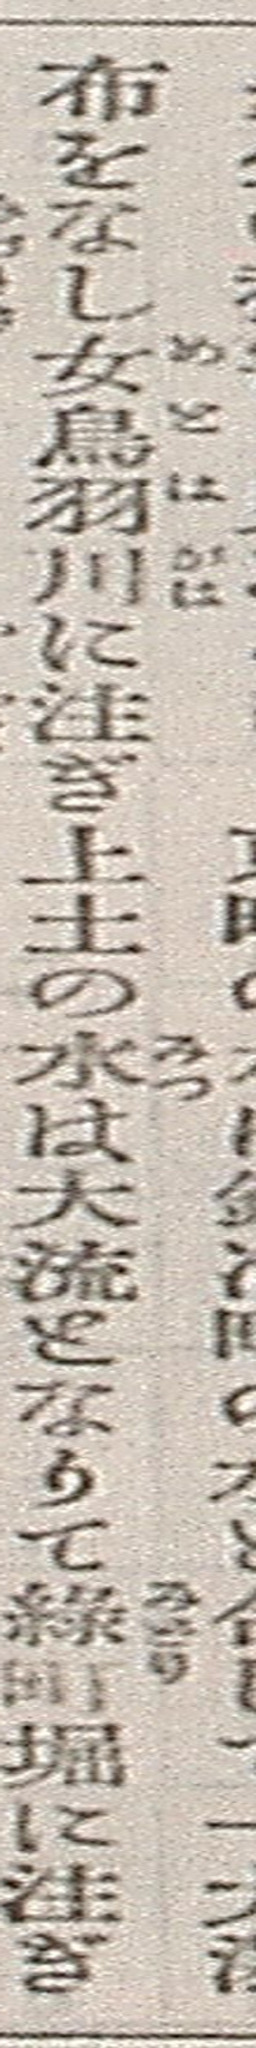布をなし女鳥羽川に注ぎ上土の水は大流となりて緑町堀に注ぎ
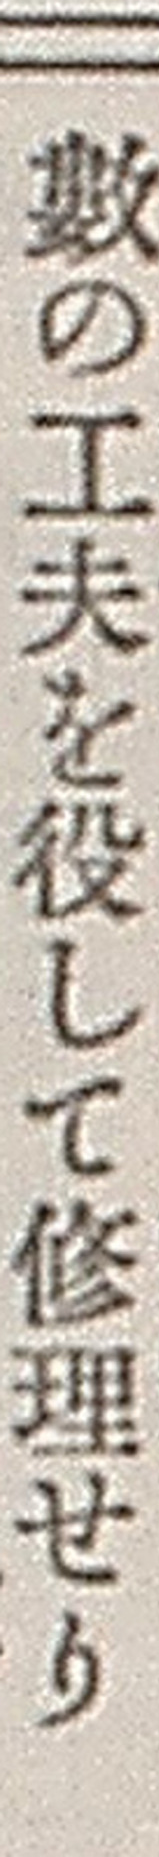数の工夫を役して修理せり
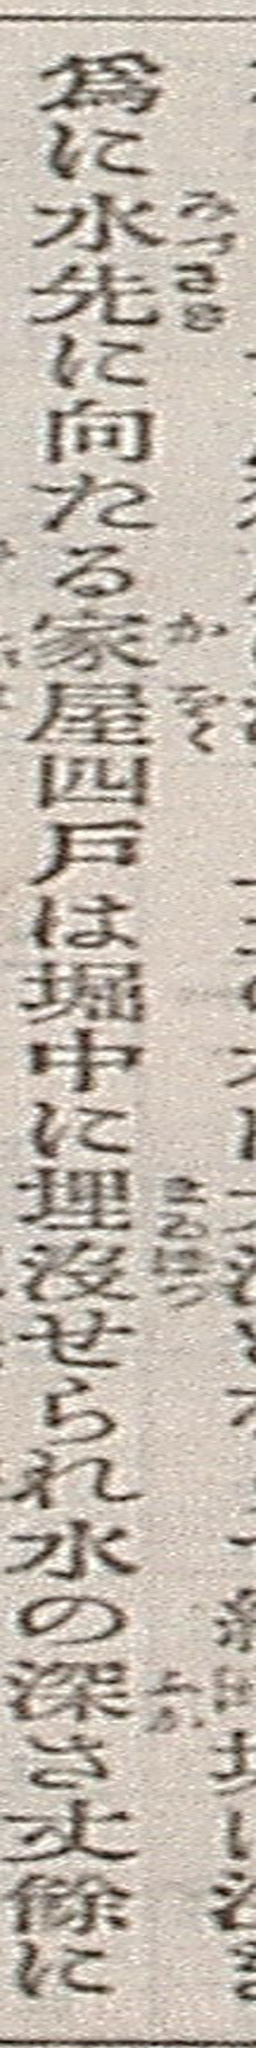為に水先に向たる家屋四戸は堀中に埋没せられ水の深さ丈餘に
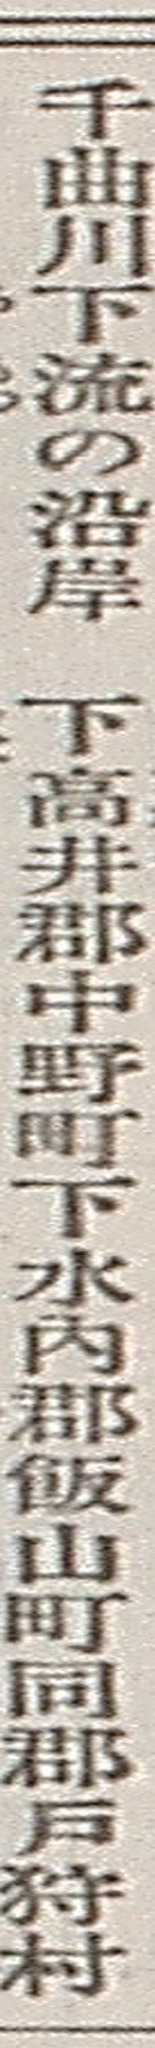千曲川下流の沿岸下高井郡中野町下水内郡飯山町同郡戸狩村
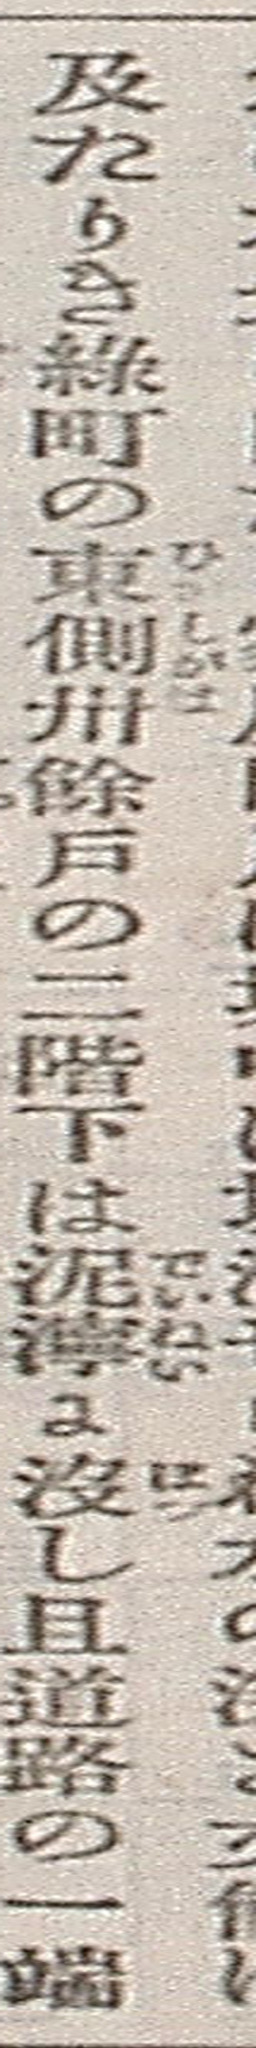及びたりき緑町の東側卅餘戸の二階下は泥濘に没し且道路の一端
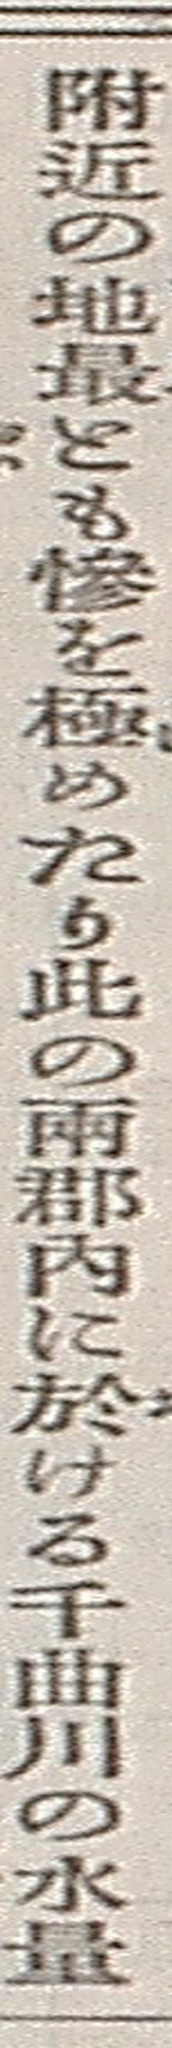附近の地最とも惨を極めたり此の兩郡内に於ける千曲川の水量
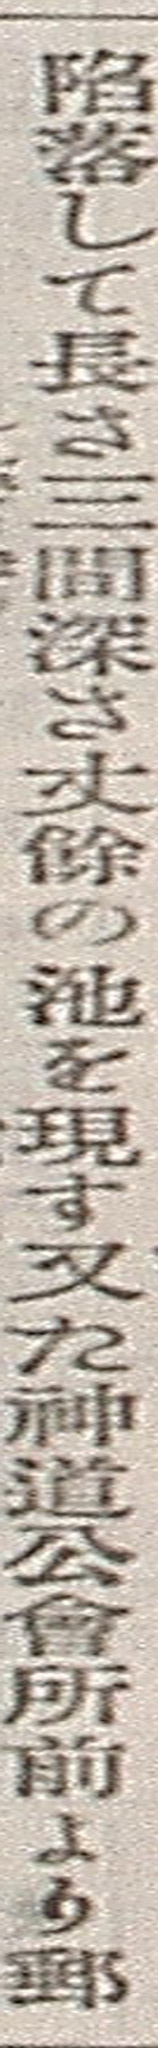陥落して長さ三間餘深さ丈餘の池を現す又た神道公会所より郵
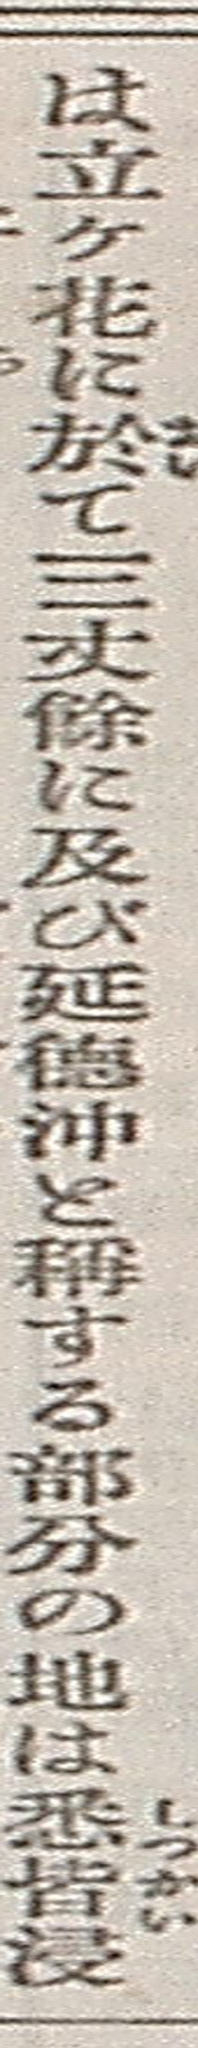は立ヶ花に於て三丈餘に及び延徳沖と称する部分の地は悉皆浸
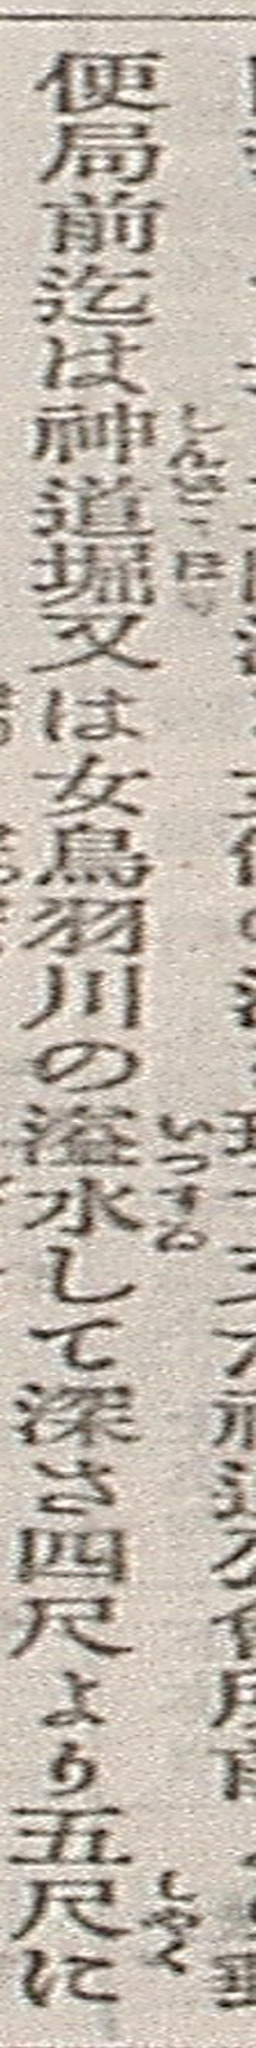便局前迄は神道堀又は女鳥羽川の溢水して深さ四尺より五尺に
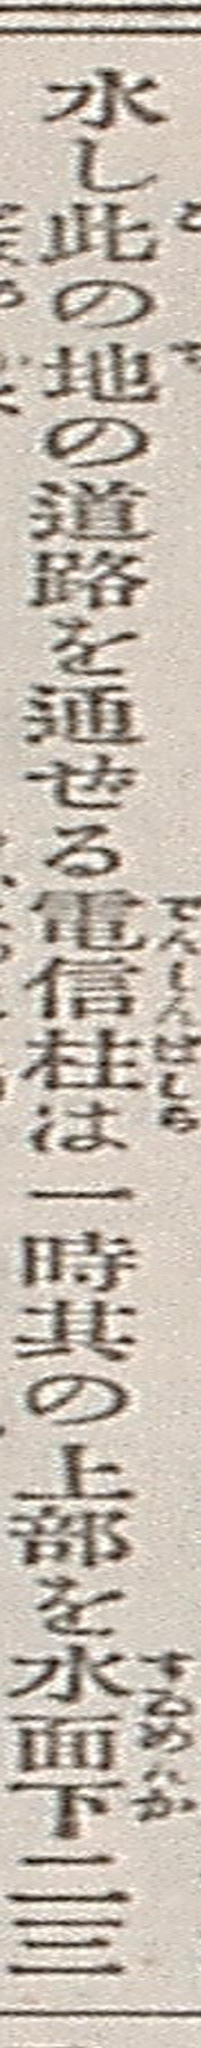水し此の地の道路を通ぜる電信柱は一時其の上部を水面下二三
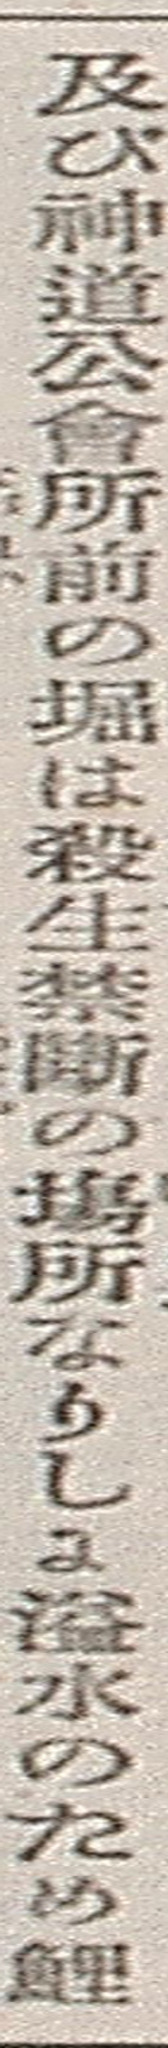及び神道公会所前の堀は殺生禁断の場所なりしに溢水のため鯉
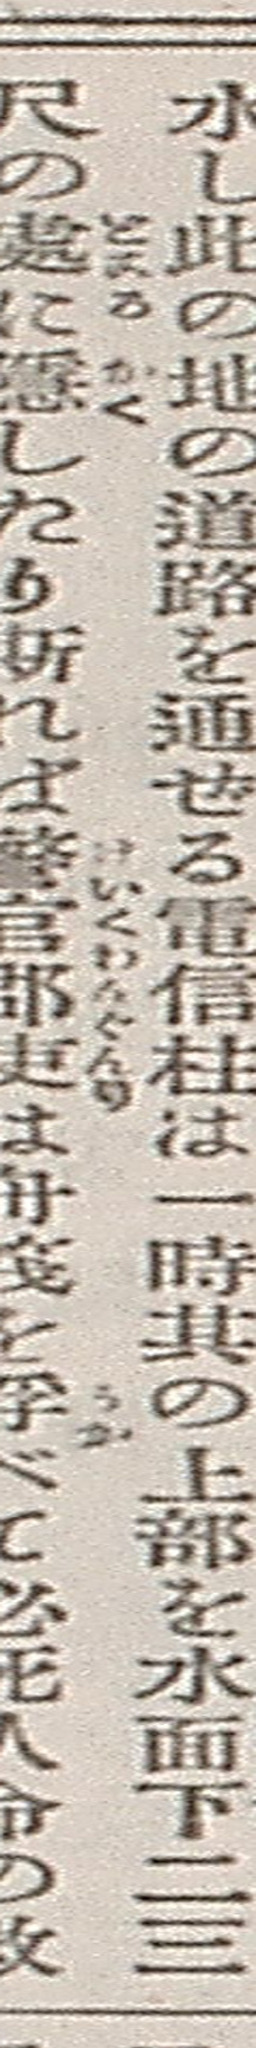尺の処に隠したり斯れば警官郡吏は舟筏を浮べて必死人命の救
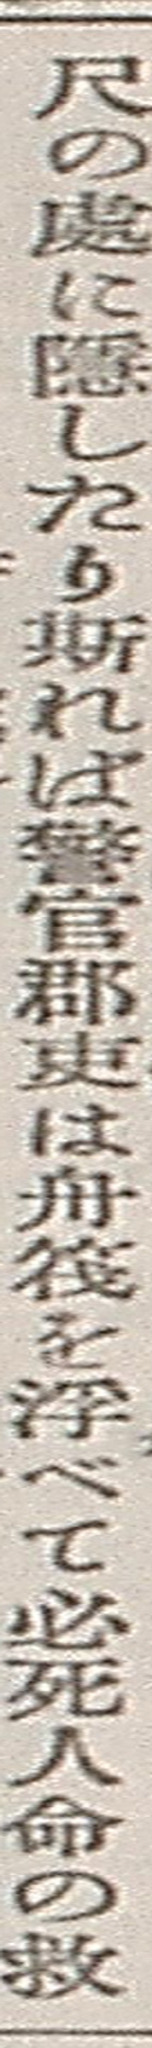尺の処に隠したり斯れば警官郡吏は舟筏を浮べて必死人命の救
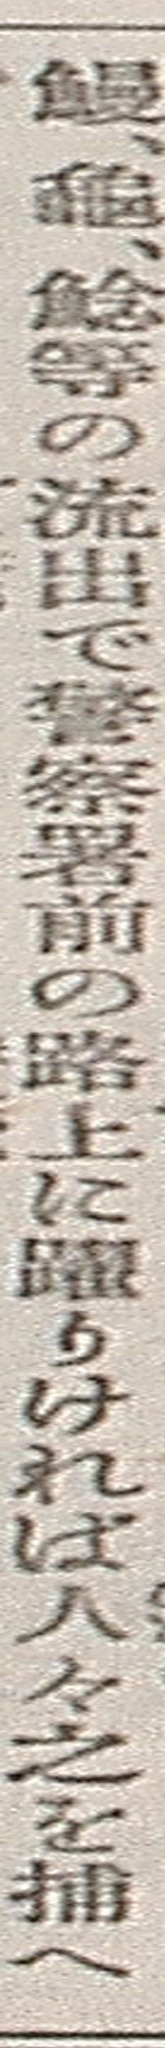鰻、亀、鯰等の流出で警察署前の路上に躍りければ人々之を捕へ
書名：風俗畫報臨時増刊第百二十六號　洪水被害録（中）
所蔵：東京大学地震研究所図書室 Earthquake Research Institute Library, The University of Tokyo, JAPAN
